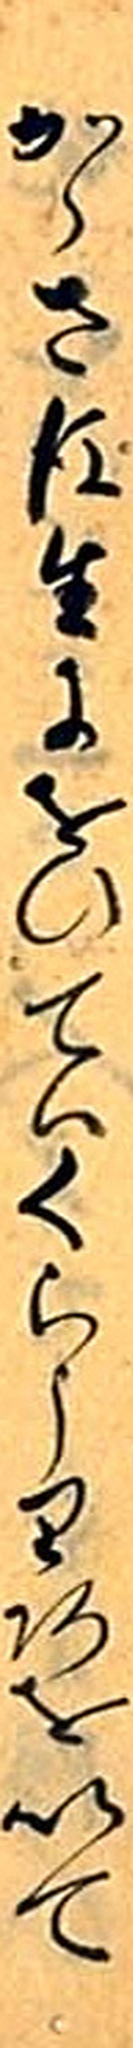からさ後生にをひてはくらうりあを以て
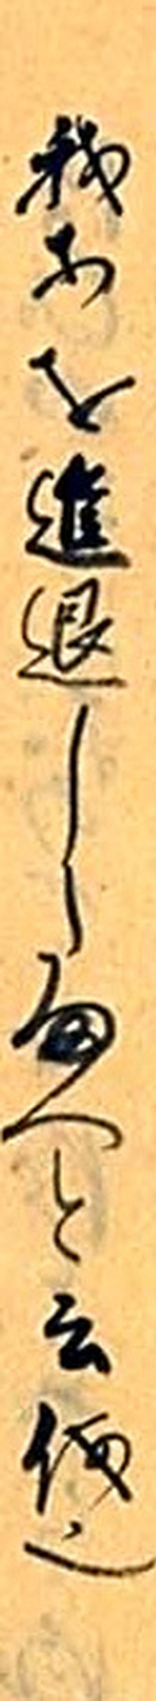我等を進退したまへと云儀也
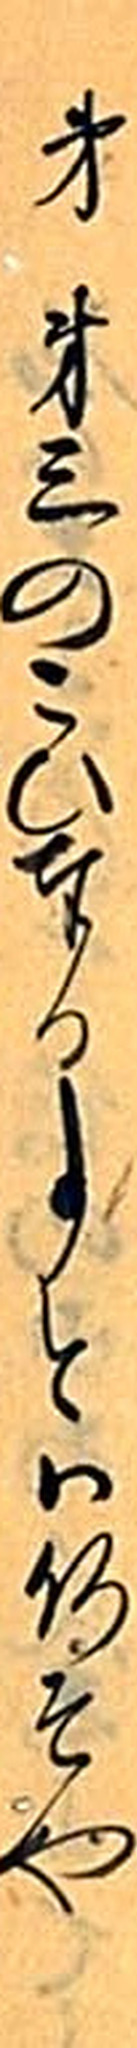弟第三のこひ奉る事とは何そや
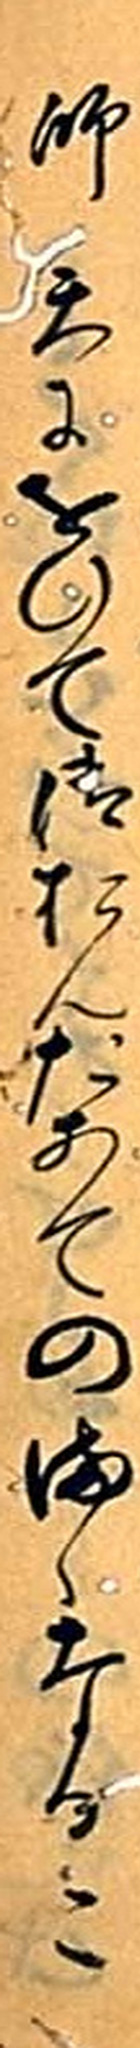師天にをひて御おんたあてのまゝなるこ

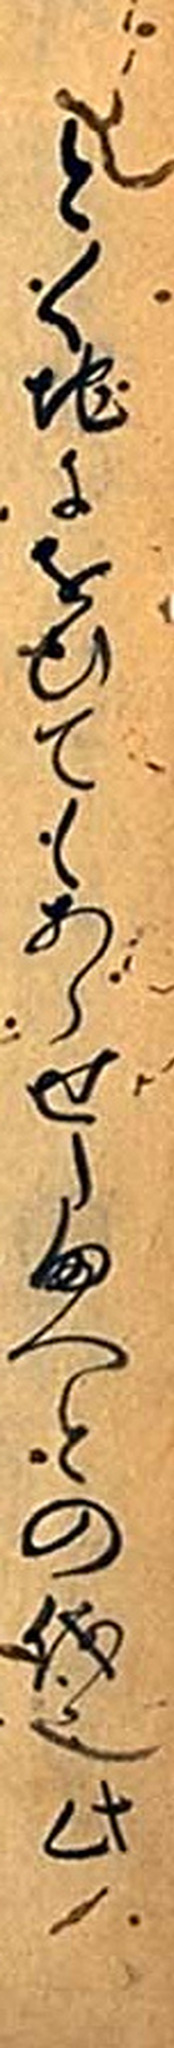とく地にをひてもあらせたまへとの儀也此
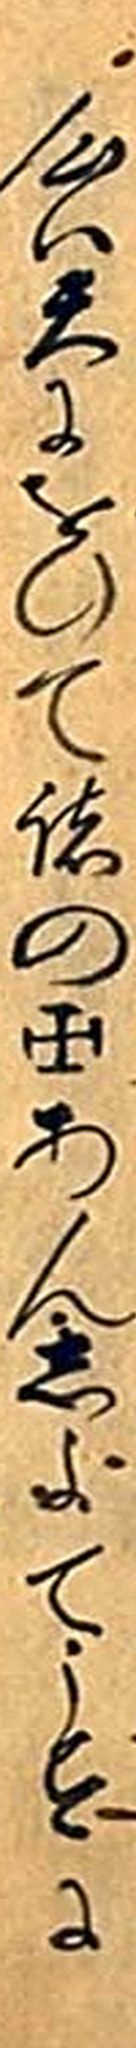心は天にをひて諸の☩あんしよてうすに
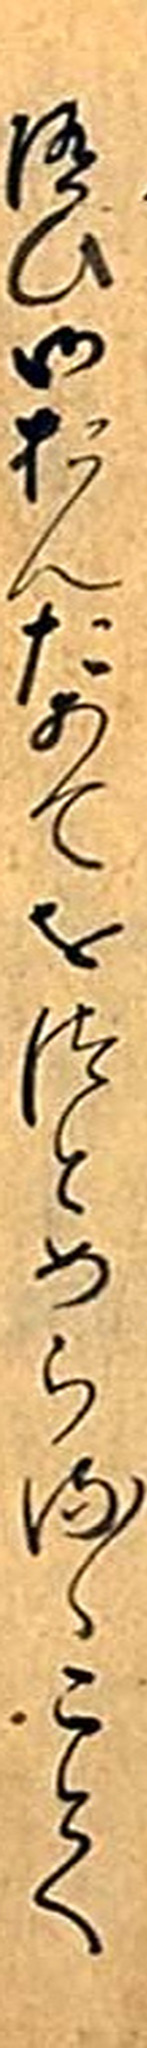随ひ御おんたあてをつとめらるゝことく
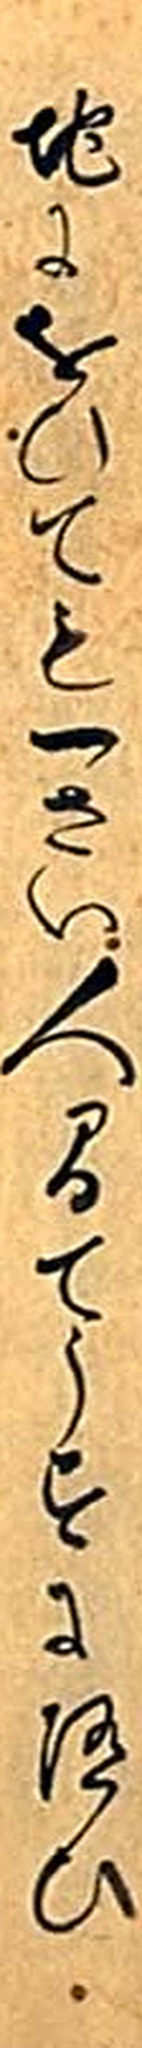地にをひても一さい人間てうすに随ひ
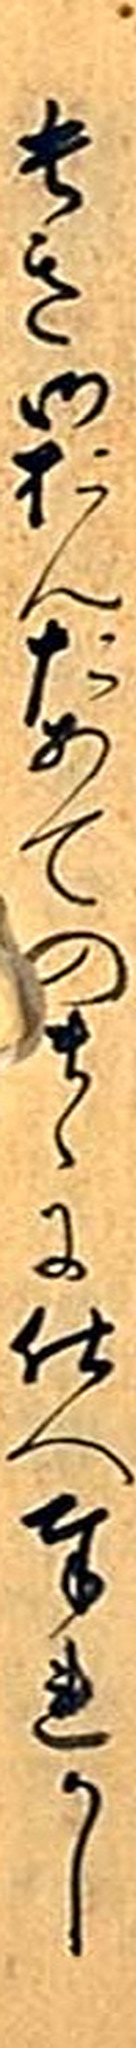貴き御おんたあてのまゝに仕へ奉れかし
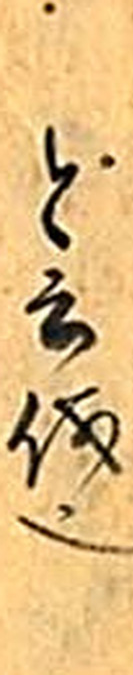と云儀也
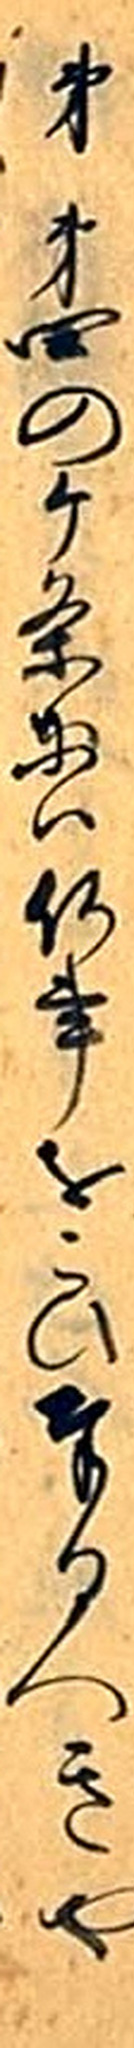弟第四のケ条には何事をこひ奉るへきや
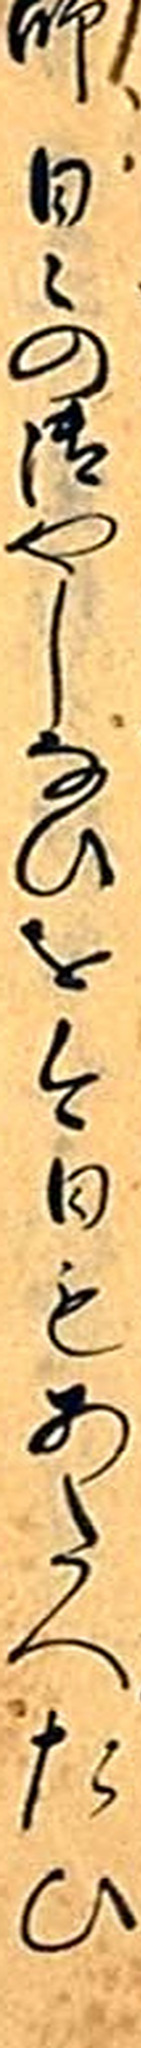師日々の御やしなひを今日もあたへたひ
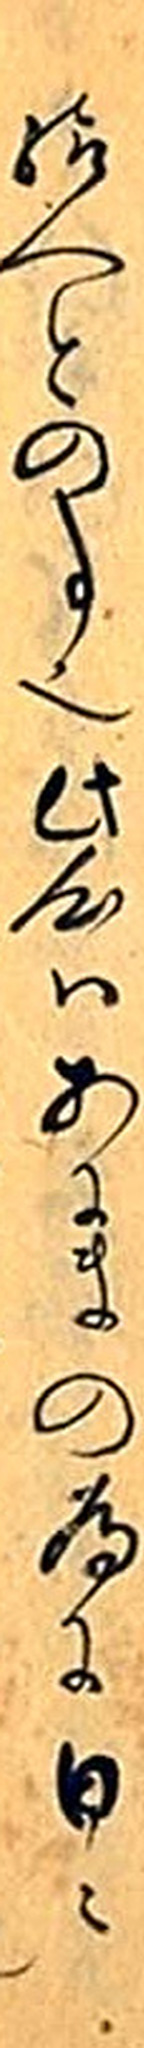給へとの事也此心はあにまの為に日々
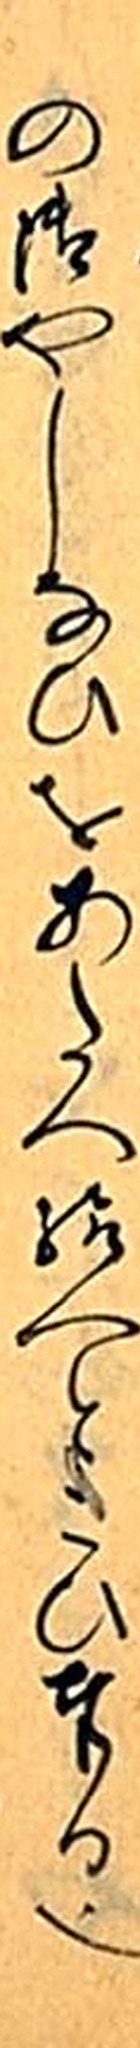の御やしなひをあたへ給へとこひ奉る也
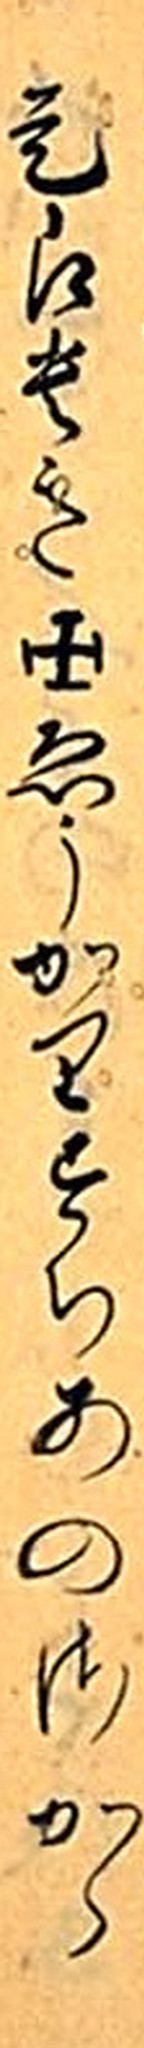是即貴き☩ゑうかりすちあのさから
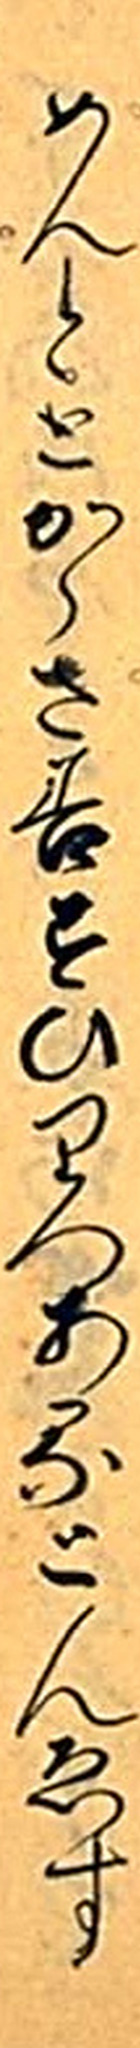めんととからさ善すひりつあるとんゑす
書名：ドチリナ・キリシタン
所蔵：東京大学総合図書館 / General Library in the University of Tokyo
